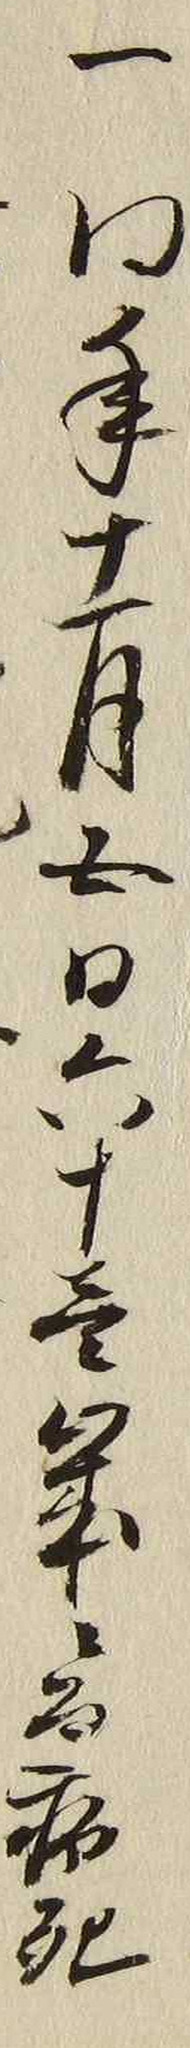一同年十一月五日六十壱歳ニ而病死
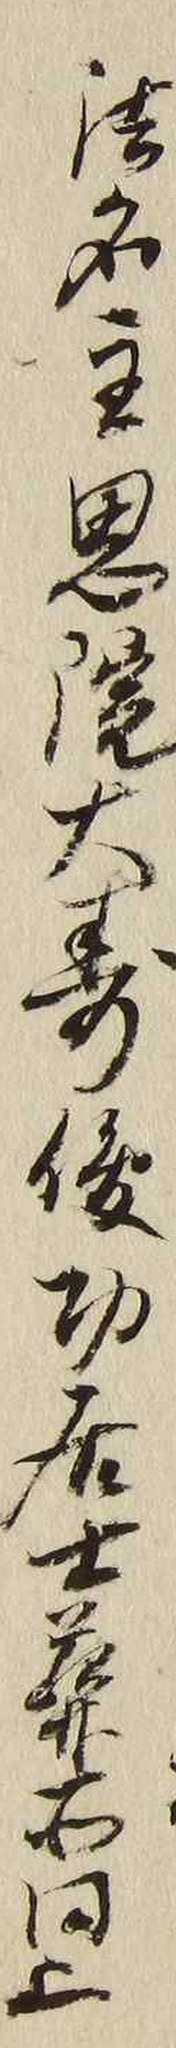法名主思院大寿俊功居士葬所同上

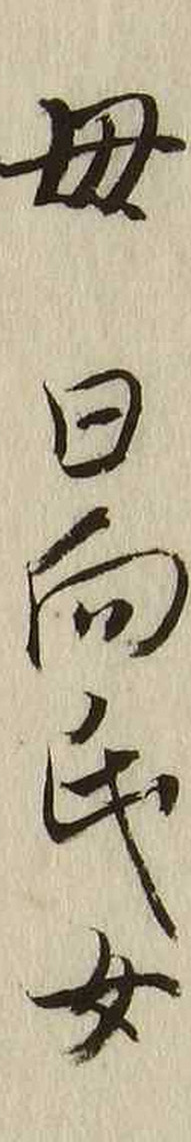母日向氏女
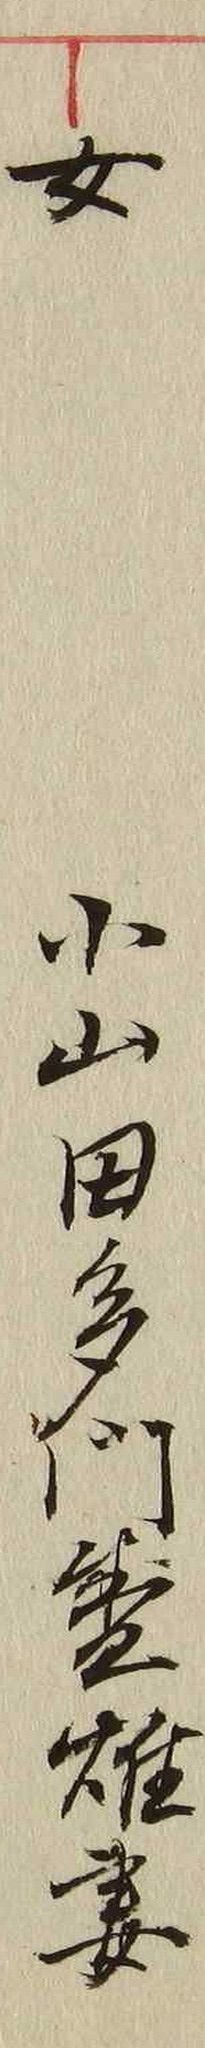女小山田多門盛雄妻
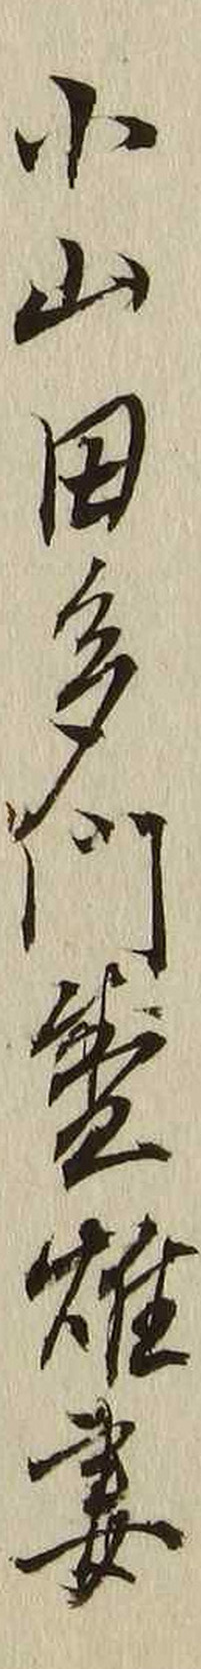女小山田多門盛雄妻
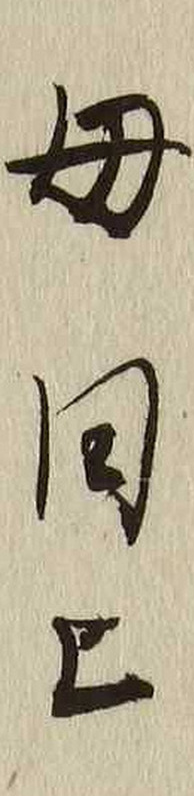母同上
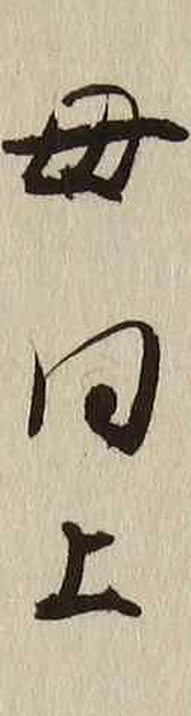母同上
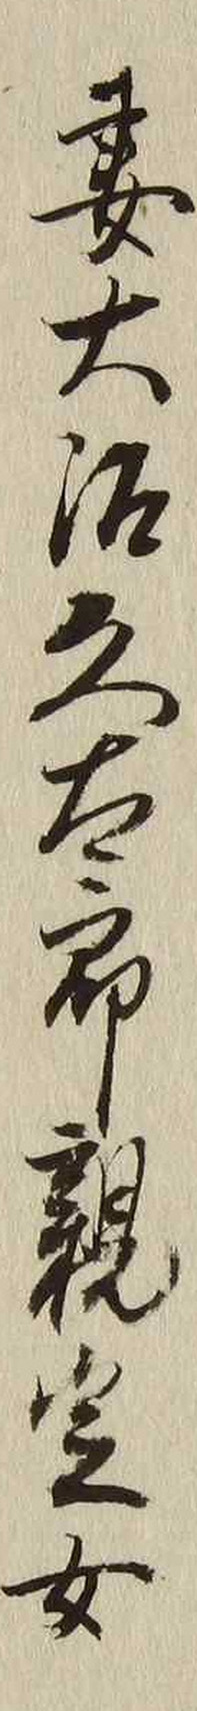妻大沼久太郎親定女
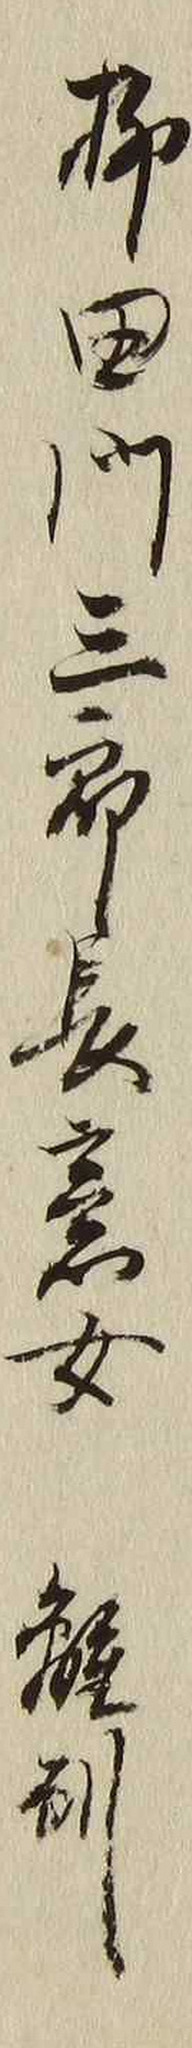柳田門三郎長意女離別
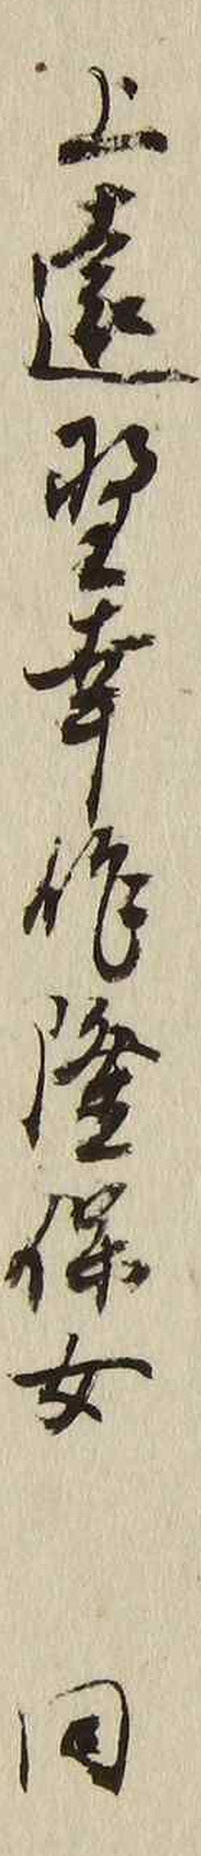上遠野幸作隆保女同
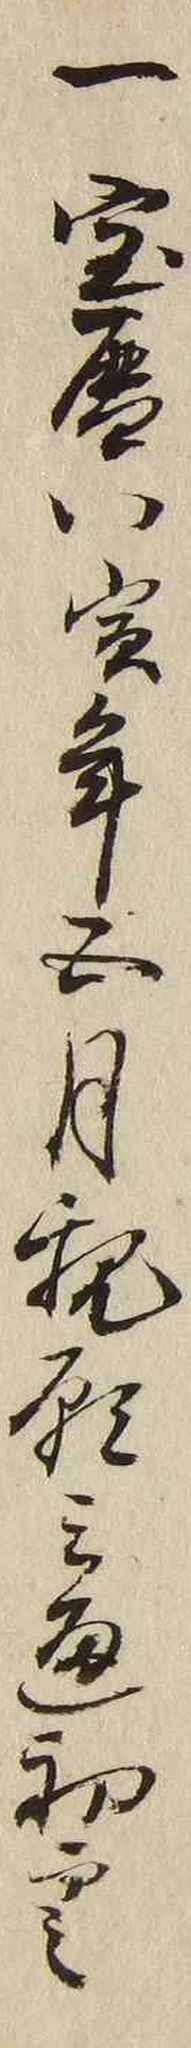一宝暦八寅年五月親願之通初而之

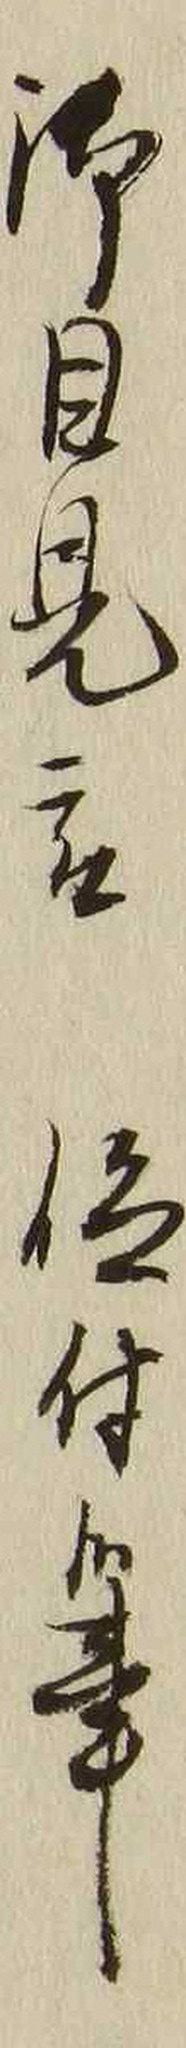御目見被仰付候事
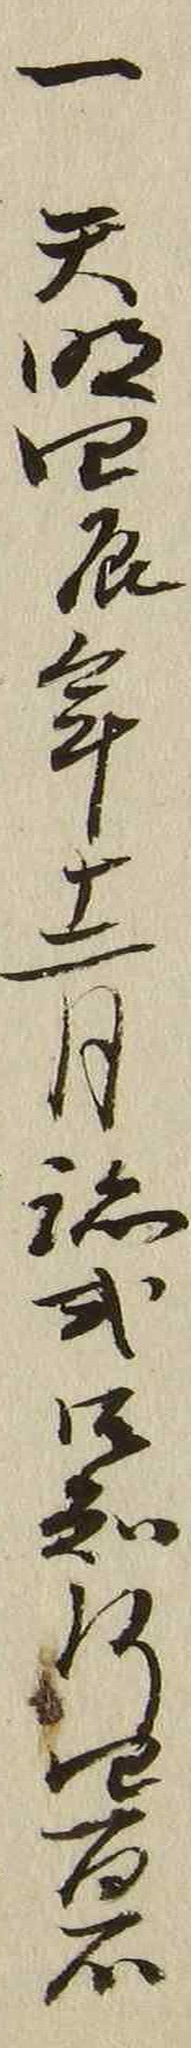一天明四辰年十二月跡式御知行四百石
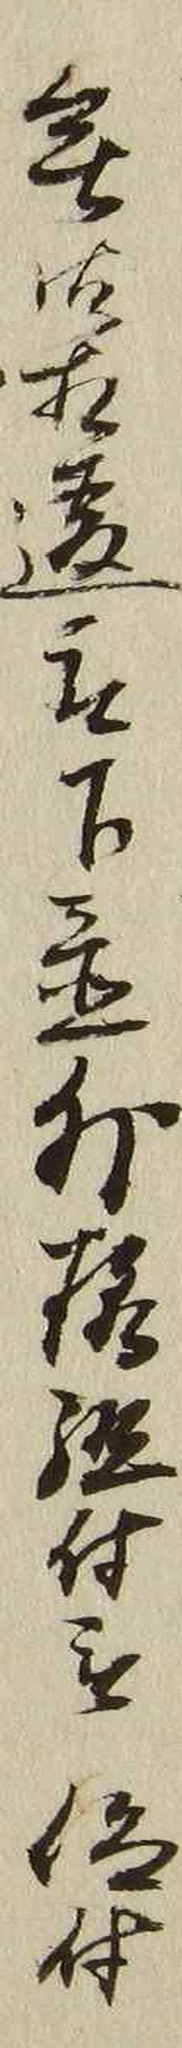無御相違被下置外様組付被仰付
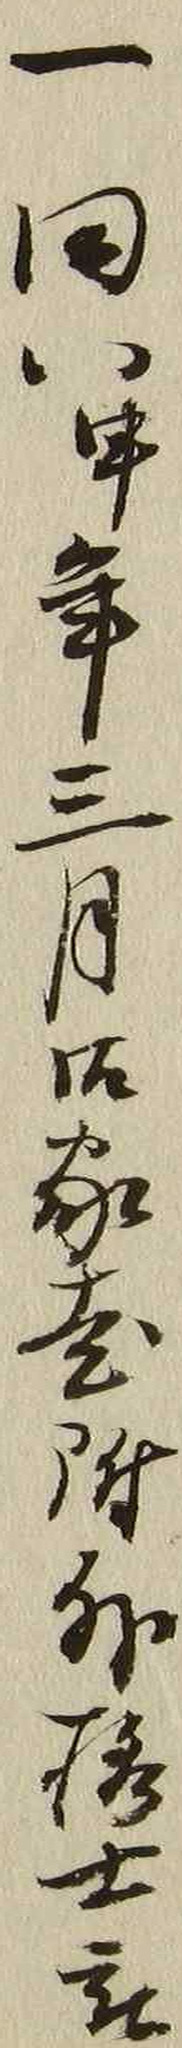一同八申年三月御家老附外様士被
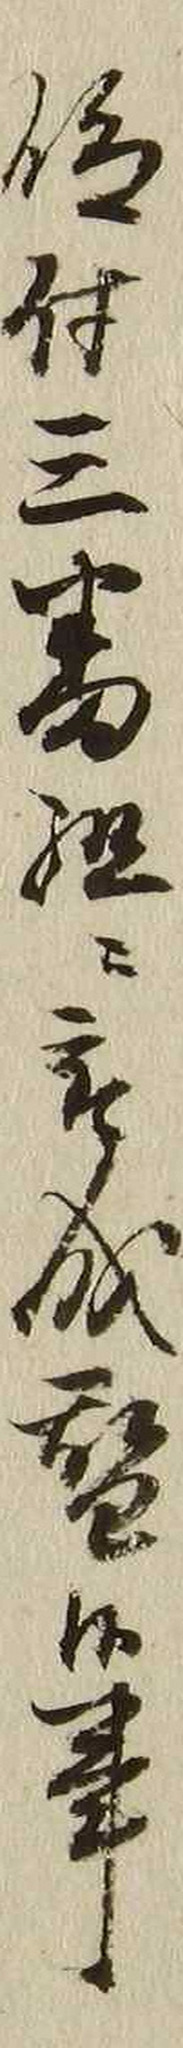仰付三番組ニ被成替候事
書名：諸士系譜　巻之348　も之部4
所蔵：会津若松市立会津図書館
